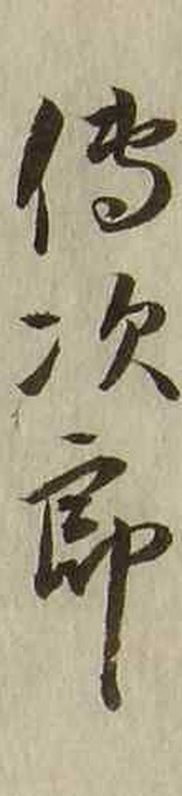伝次郎
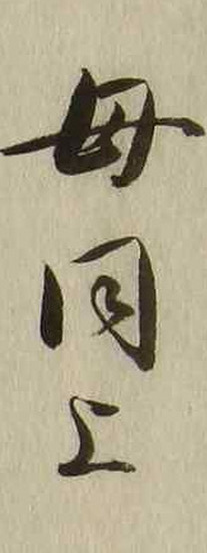母同上
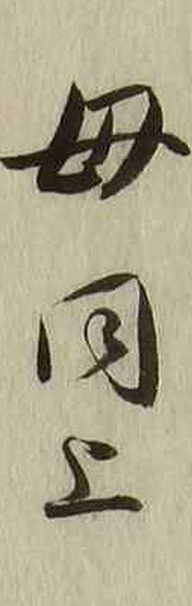母同上
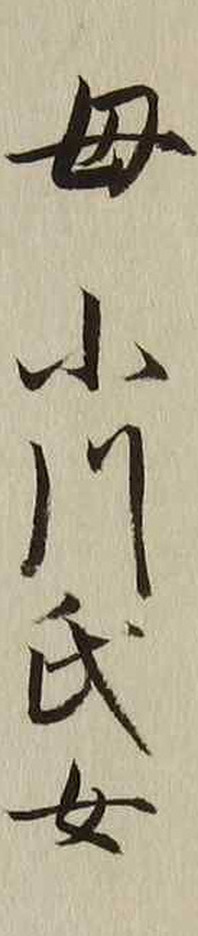母山川氏女
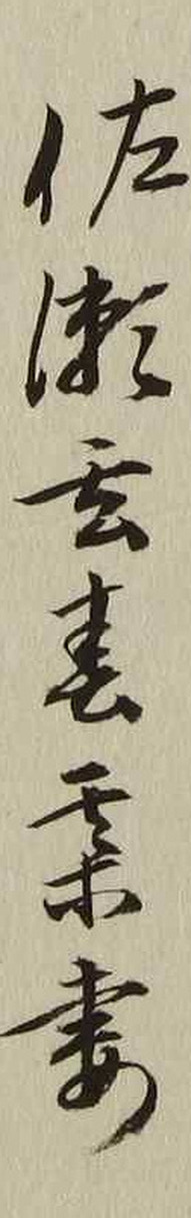女佐瀬玄春葉妻
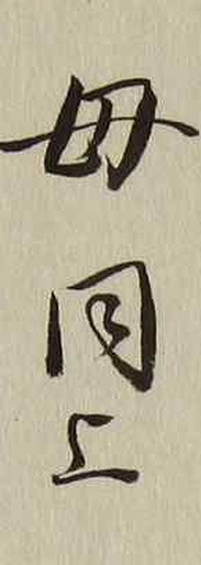母同上
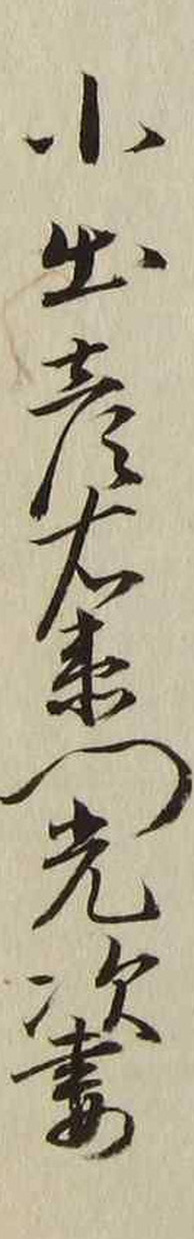女小出彦右衛門光次妻
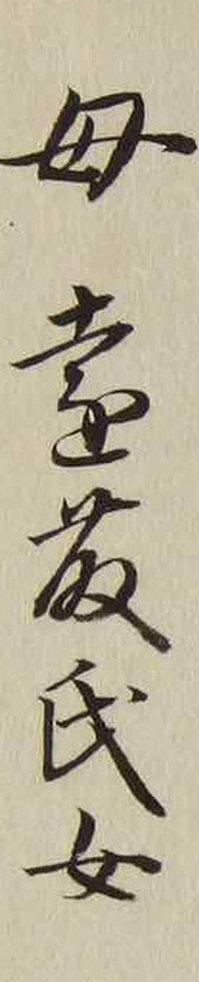母遠藤氏女

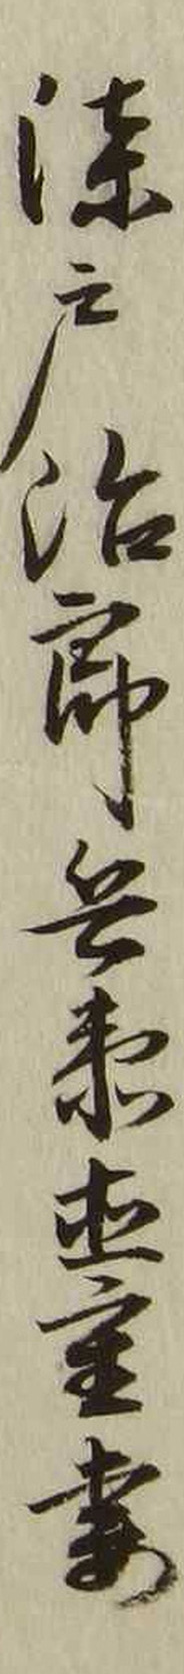女漆戸治郎兵衛直重妻
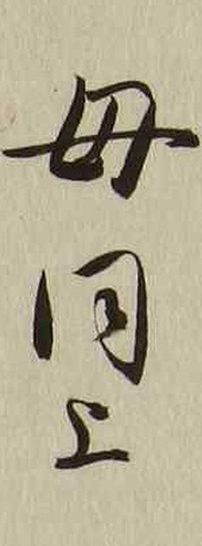母同上
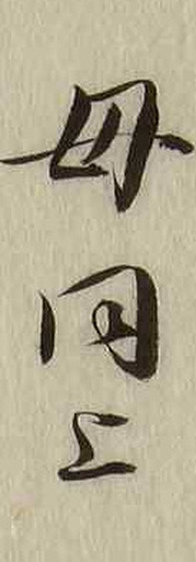母同上
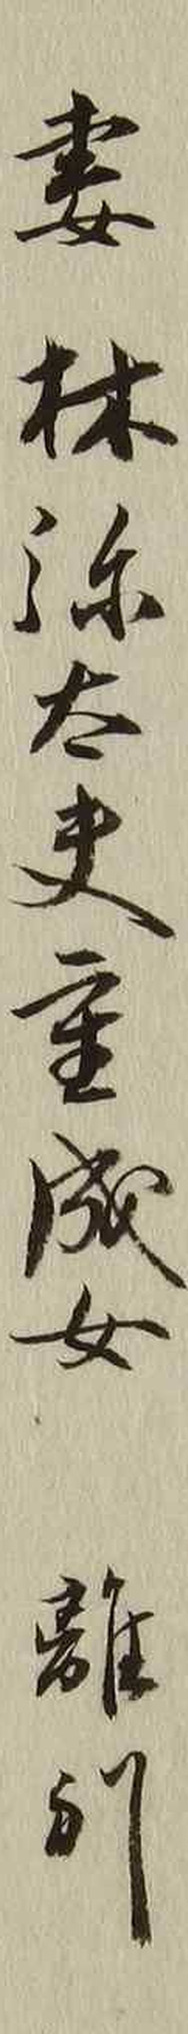妻林弥太夫重成女離別
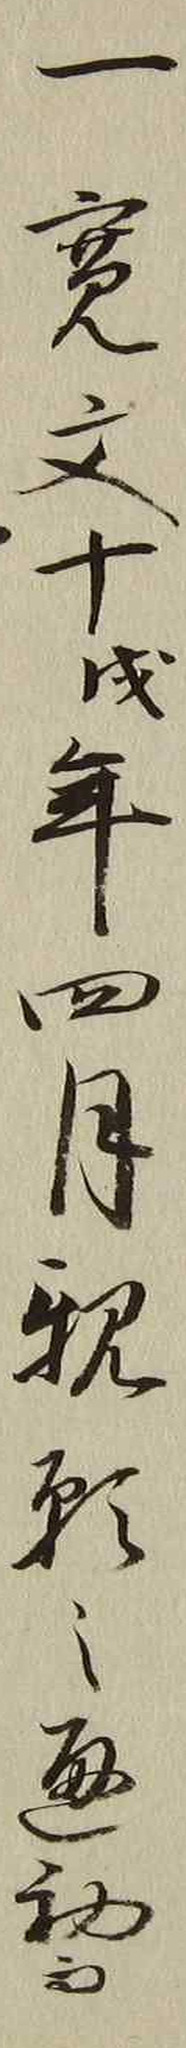一寛文十戌年四月親願之通初而
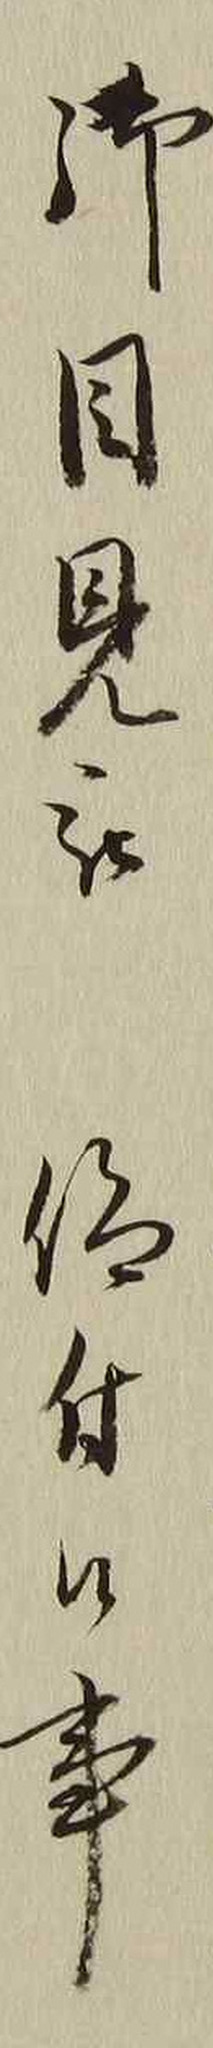之御目見被仰付候事
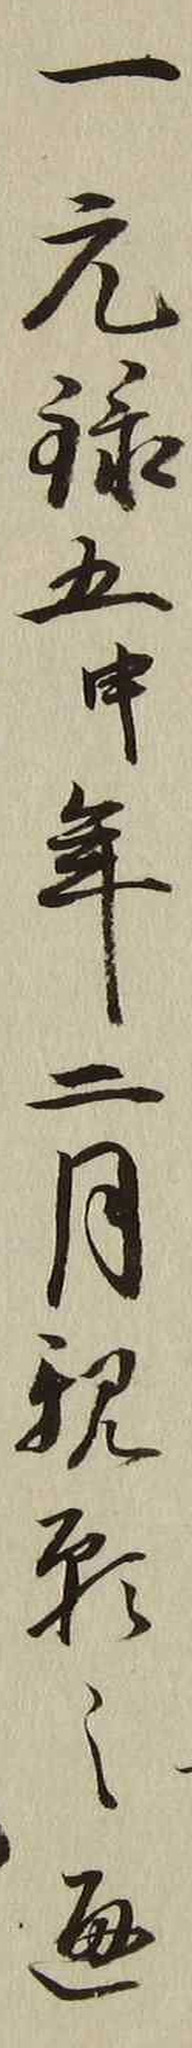一元禄五申年二月親願之通
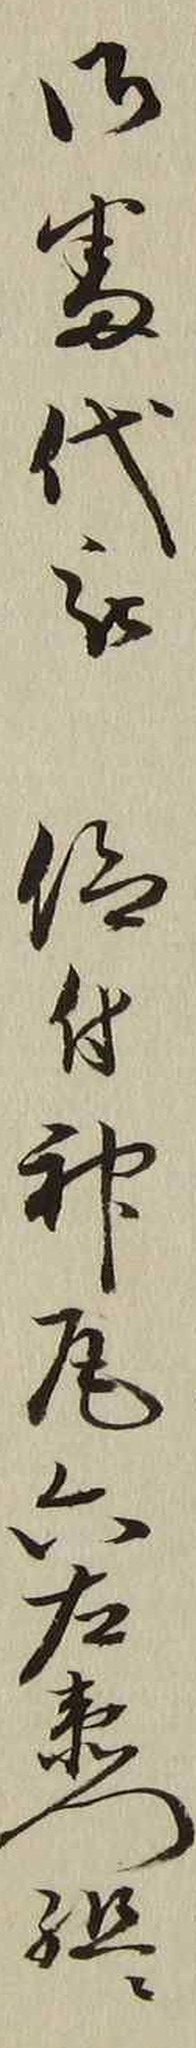御番代被仰付神尾六右衛門組ニ
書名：諸士系譜　巻之61　と之部4
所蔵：会津若松市立会津図書館
